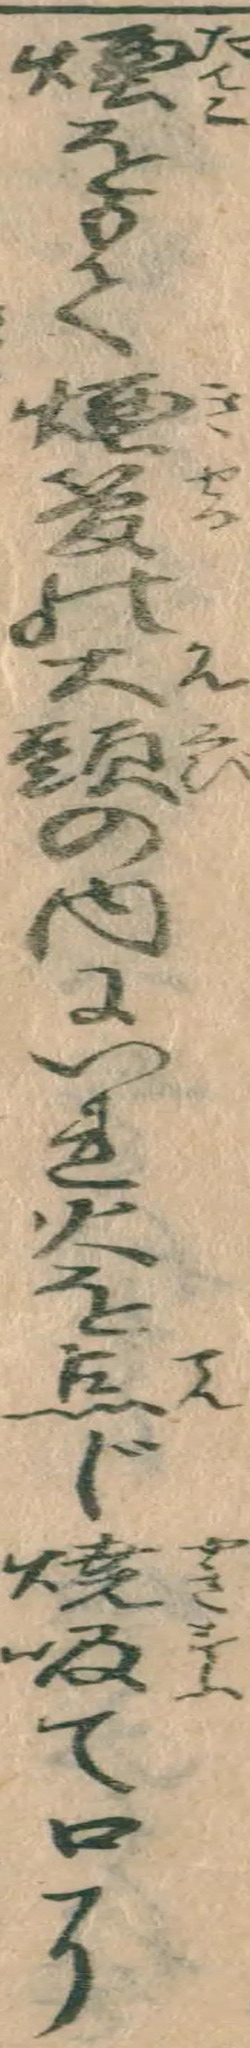煙をもて煙管の大頭の内にいれ火を点じ焼吸て口に
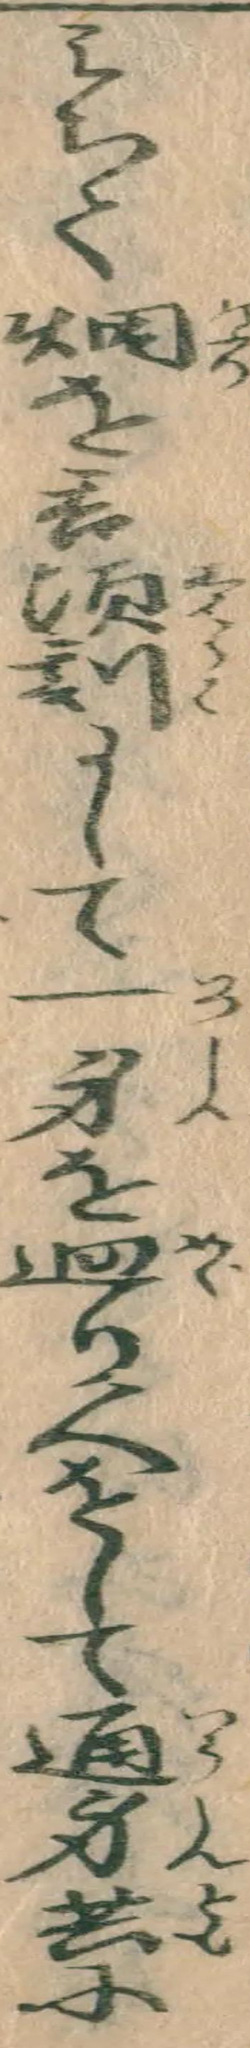みちて烟を呑頃刻にして一身を廻り人をして通身共に
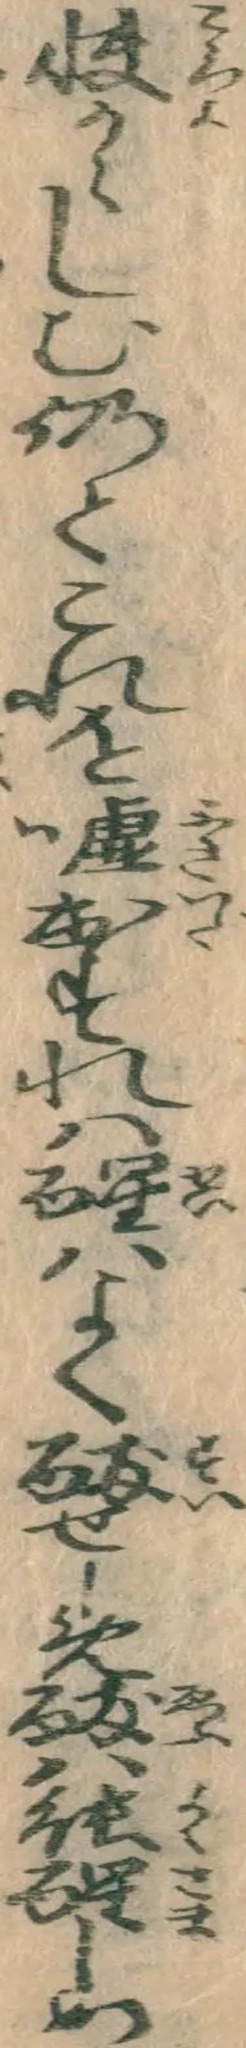快からしむ仍てこれを嘘出すれは醒はよく醉せしめ醉は能醒しめ
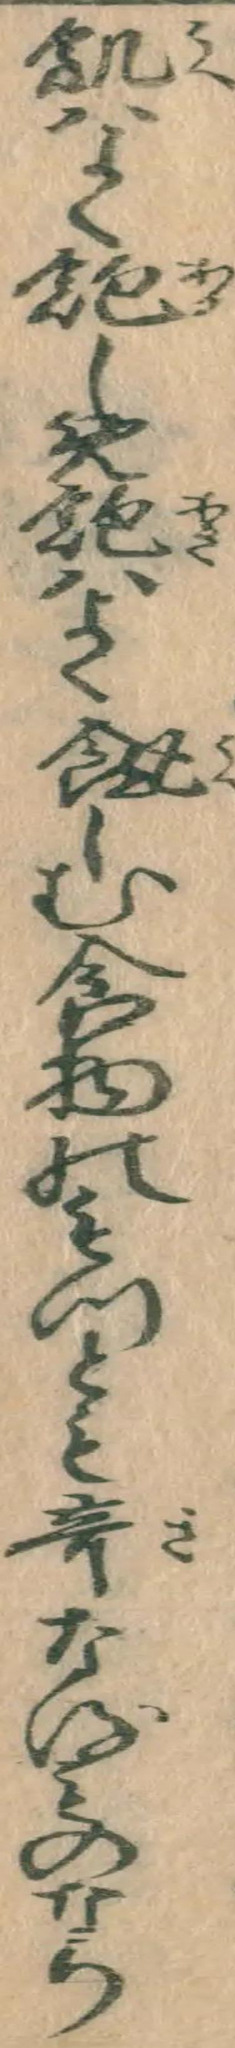飢なく飽しめ飽はよく飢しむ食物のもつとも奇なるものなり

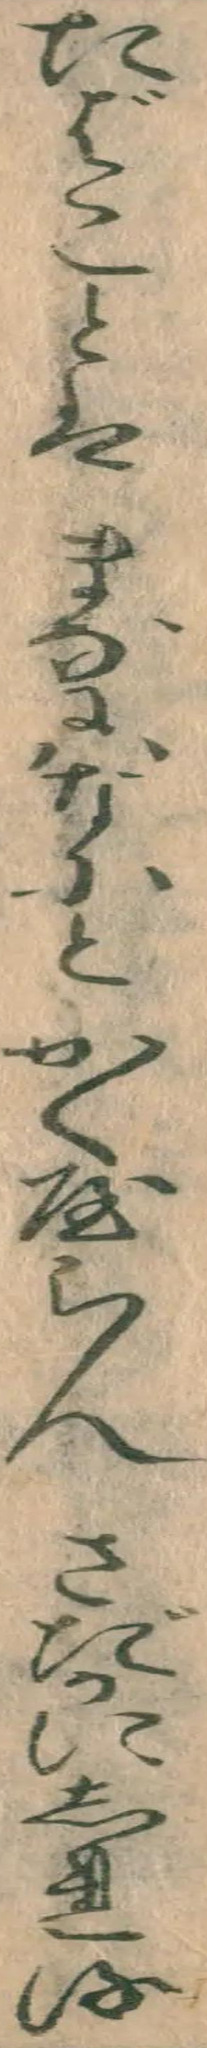たばことはまなにはなにとかくやらんさだかにしれる
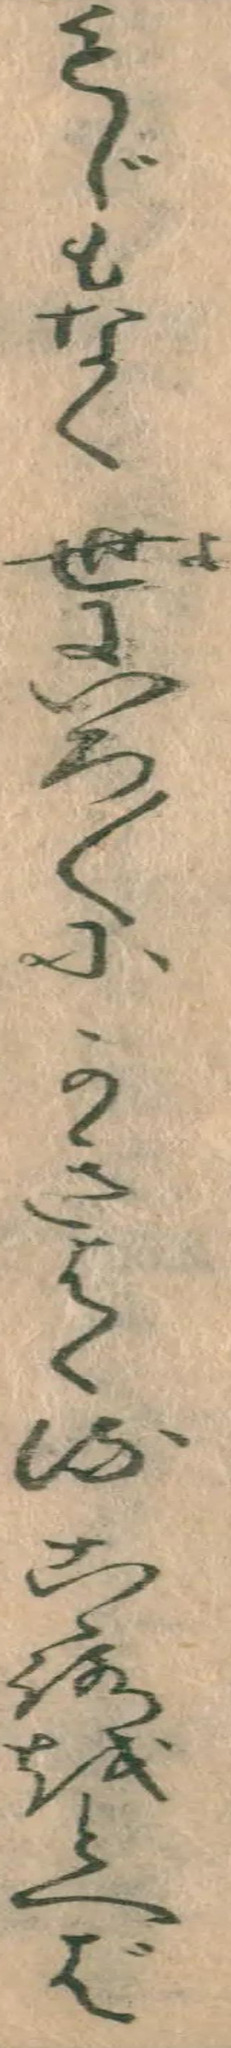もじもなく世にいろ〳〵にかきはくるこゝろをとへば
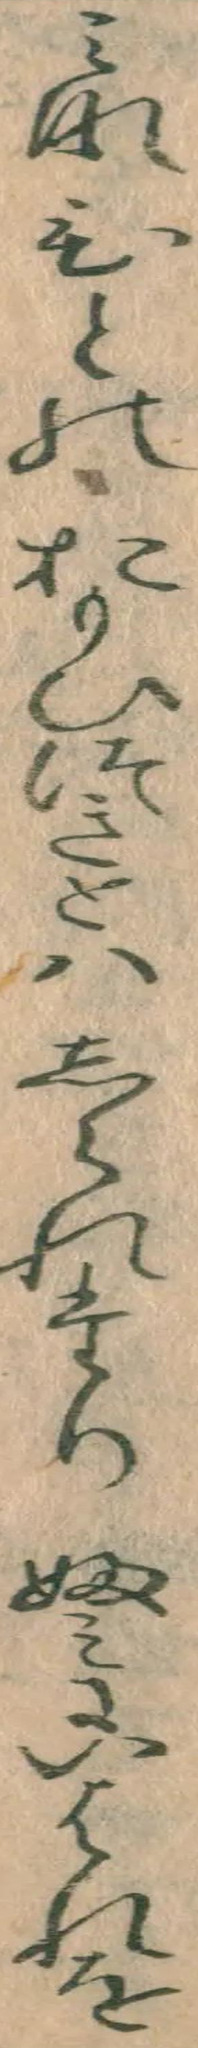みなひとのおもひつきとはしられたりふみにいはれを
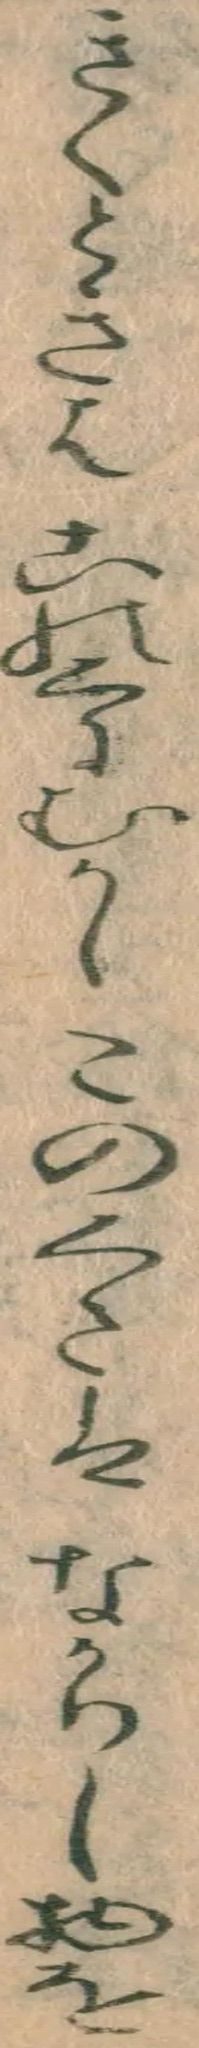きくときはこのくにむかしこのくさはなかりし物を
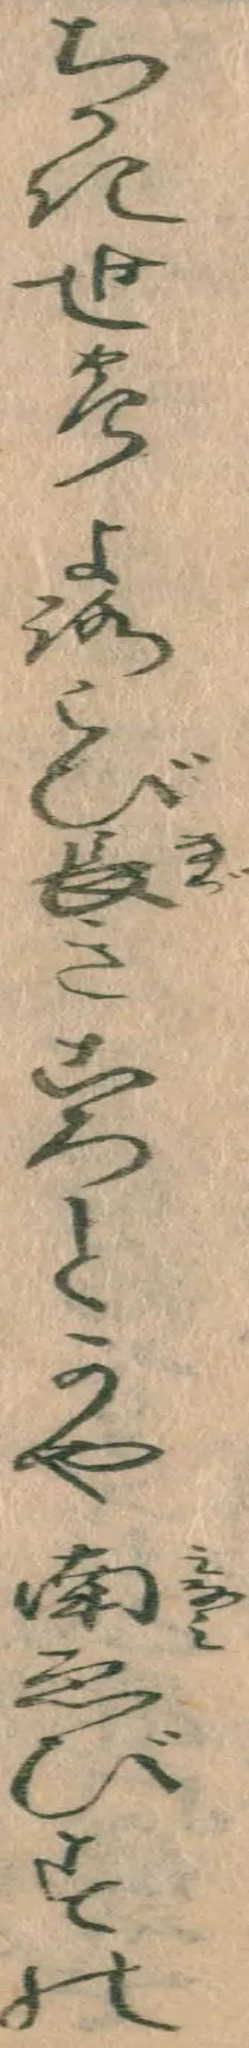ちかき世のよろこび長きころとかや南ゑびすの
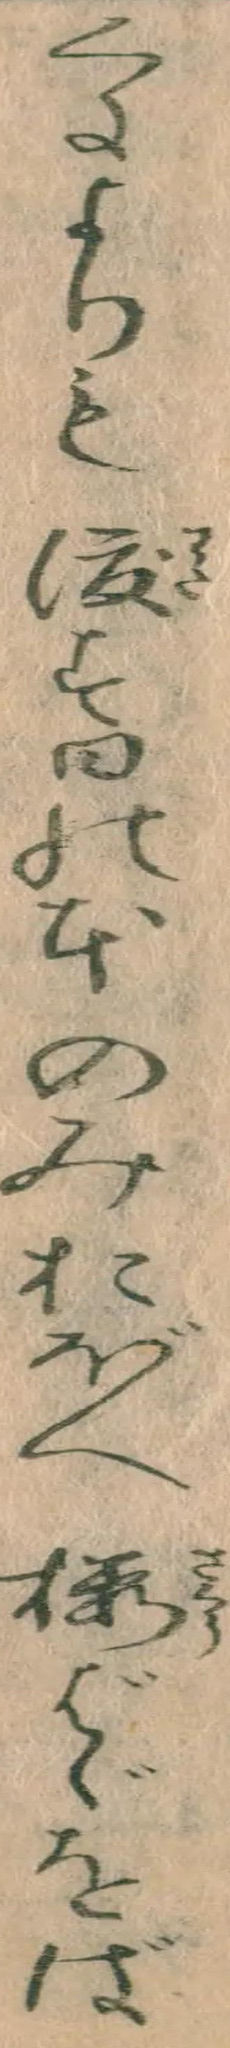くによりも渡す日の本のみおぼへ桜ばゞをば
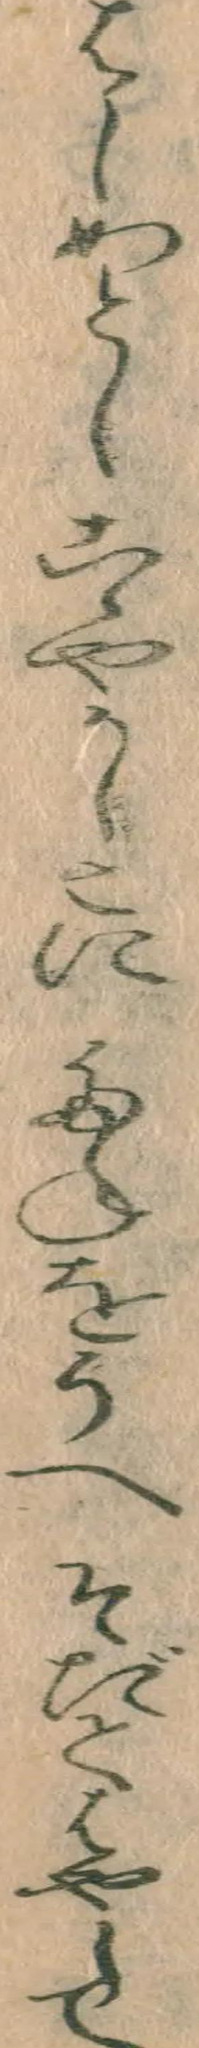はしめとしこゝやかしこにたねをうへそだてはやして
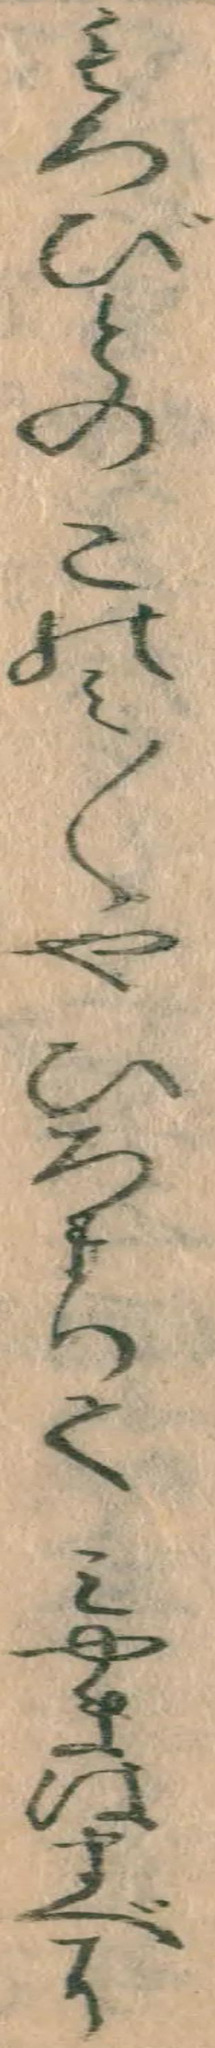もろびとのこのみ〳〵やひろまりてみやまはまべに
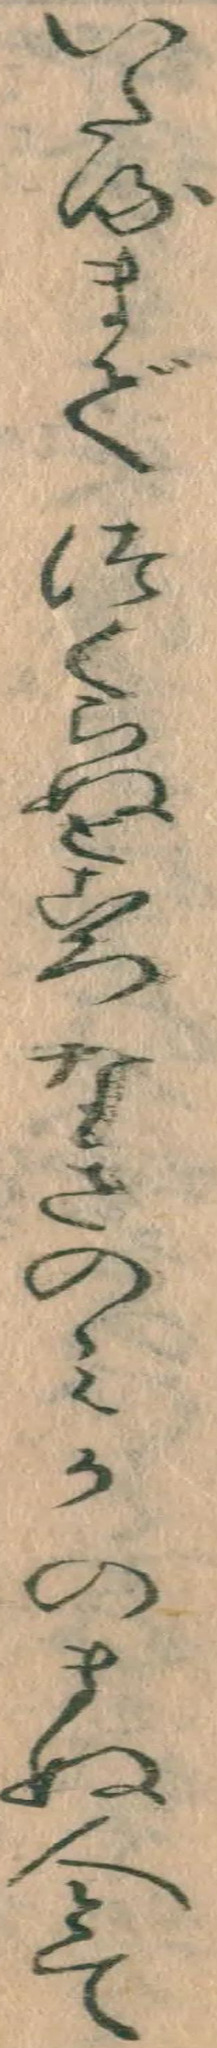いたるまでつくらぬところなきのみかのまぬ人とて
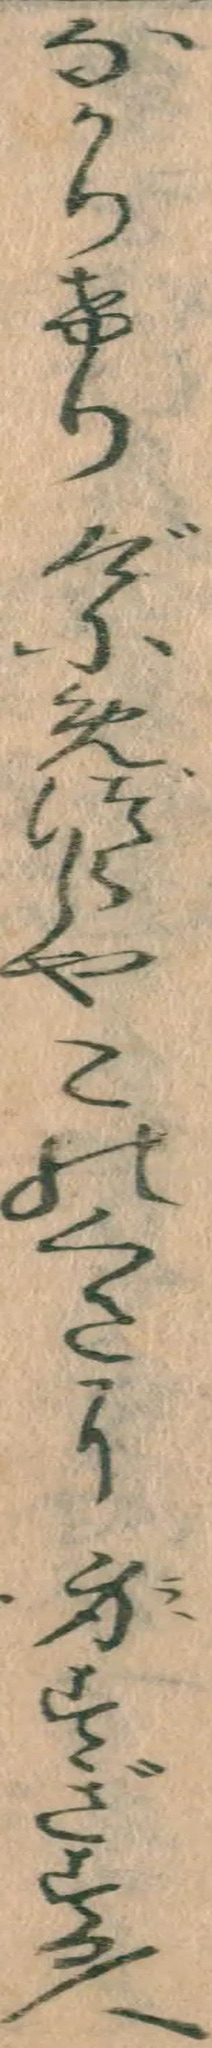なかりけりげにめづらしやこのくさに身すぎする人
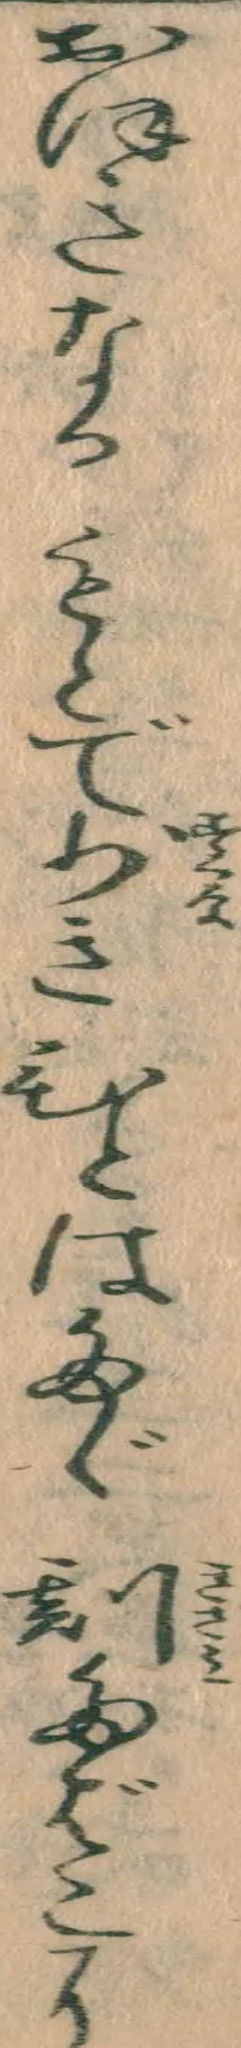おほきなるもとで少きひとはたゞ刻たばこに
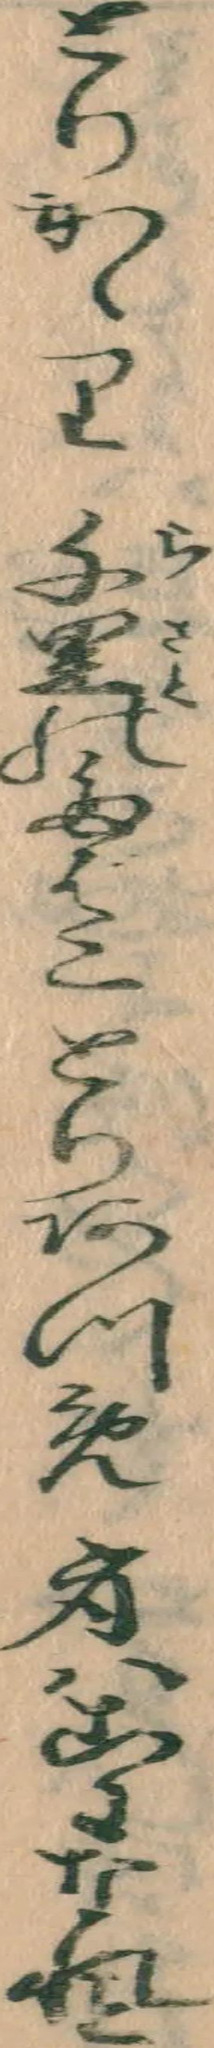とりかゝり千里のたばことりあつめ身はこになれと
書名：煙草記
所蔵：国立国会図書館 National Diet Library, JAPAN
